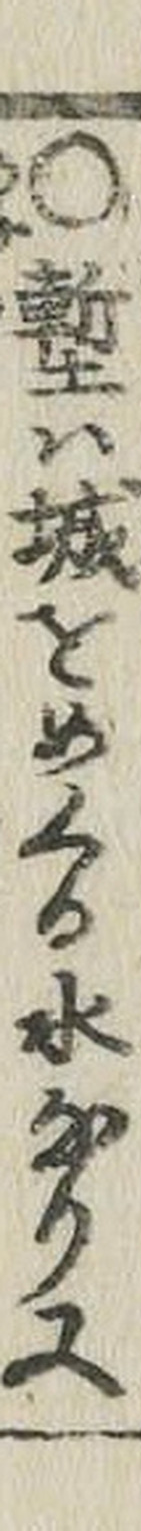○塹は城をめくる水なり又
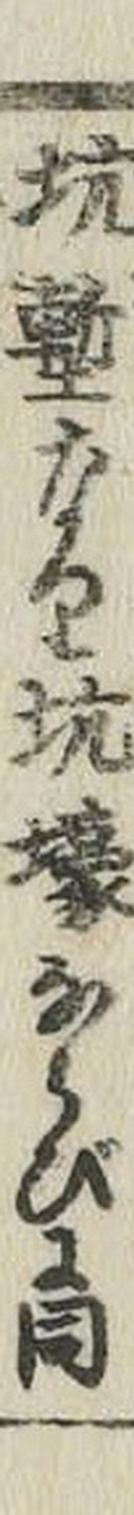坑塹なり坑壕ならびに同
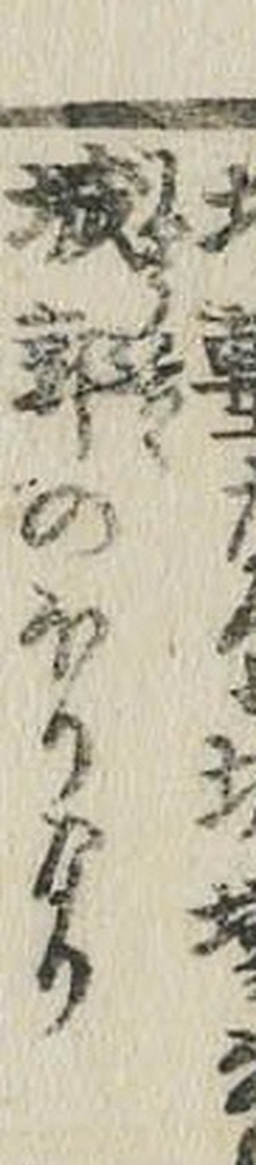城郭のほりなり
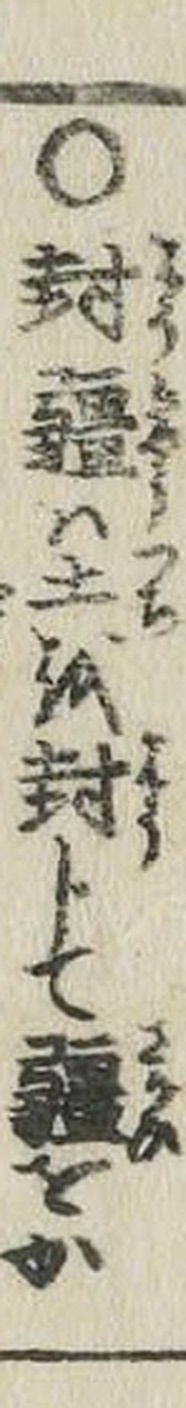○封疆は土を封じて疆をか
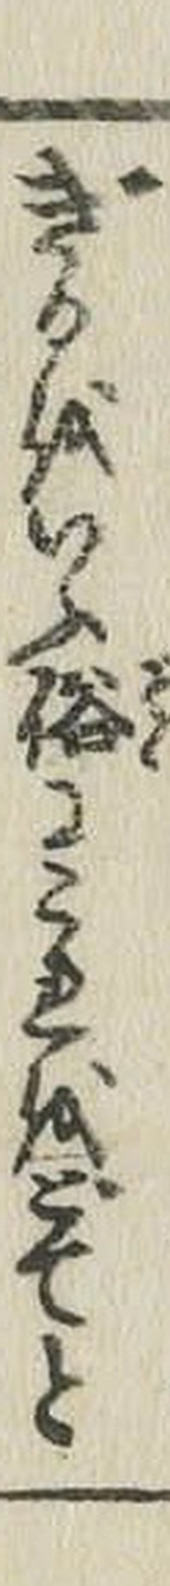ぎるをいふ俗にこれをどてと
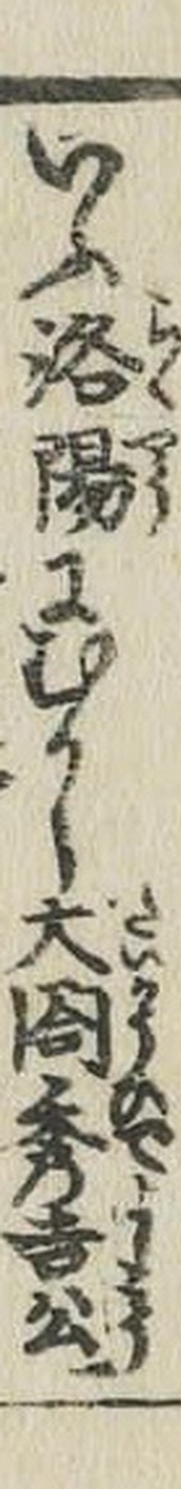いふ洛陽にむかし大閤秀吉公
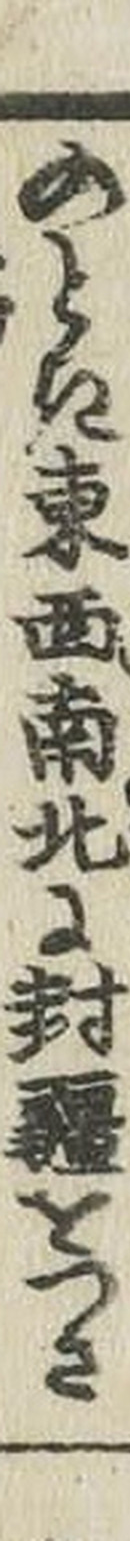のとき東西南北に封疆をつき
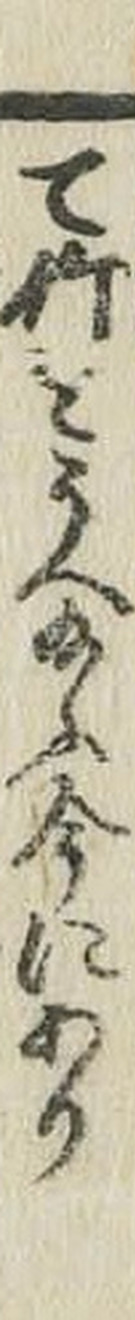て竹をうへ給ふ今にあり
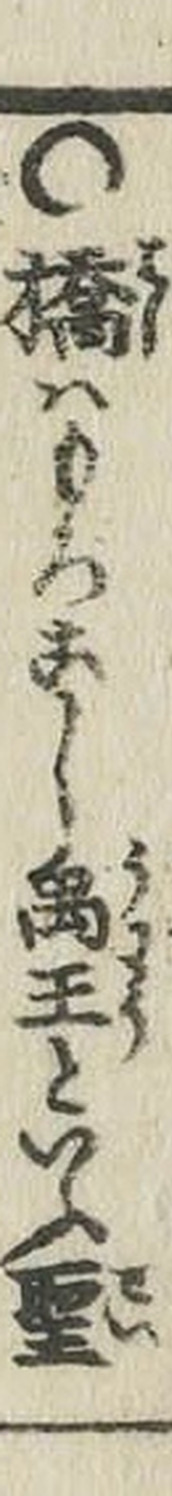○橋はもろこし禹王といふ聖
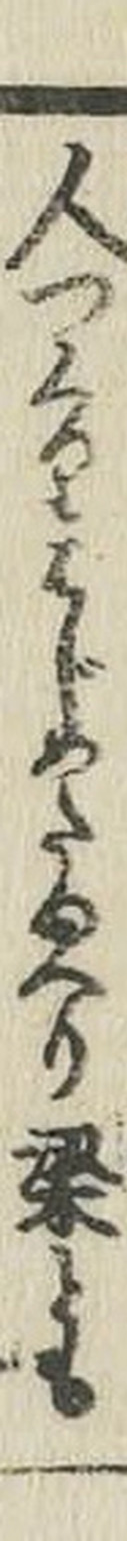人つくりはじめたまへり梁とも
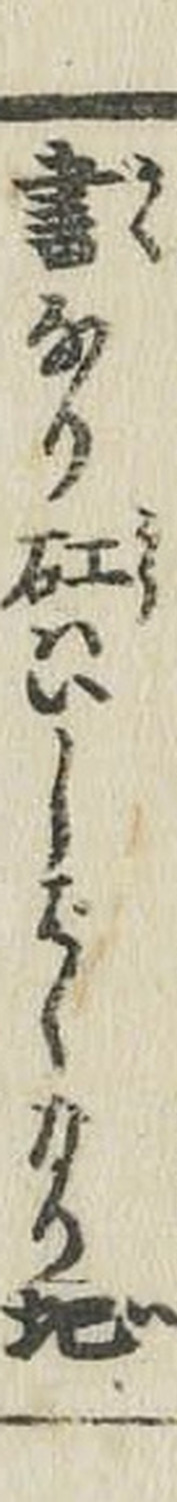書なり矼はいしばしなり圯
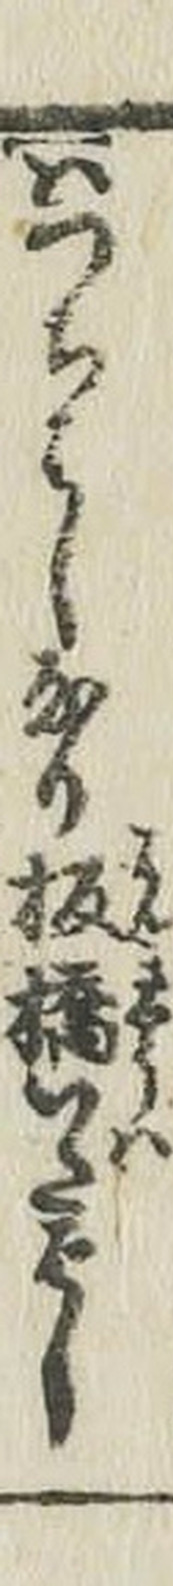はつちはしなり板橋いたばし
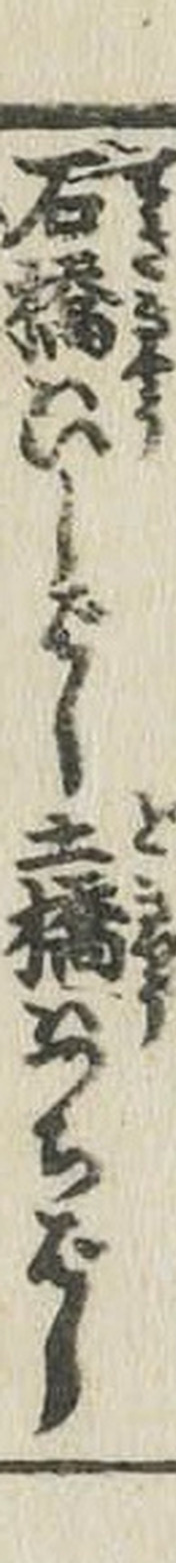石橋はいしばし土橋はつちばし
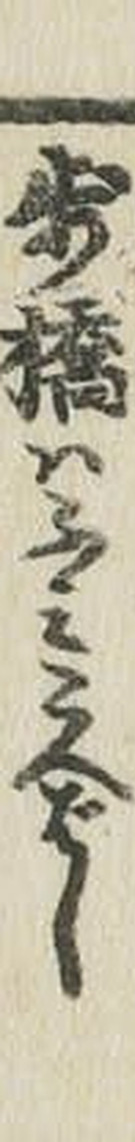歩橋はふみこへばし
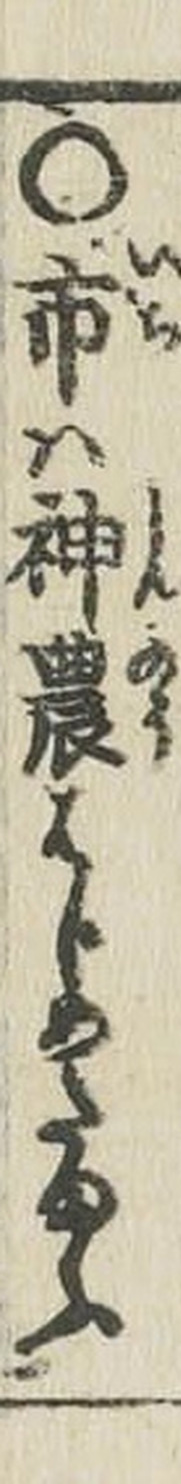○市は神農はじめたまふ
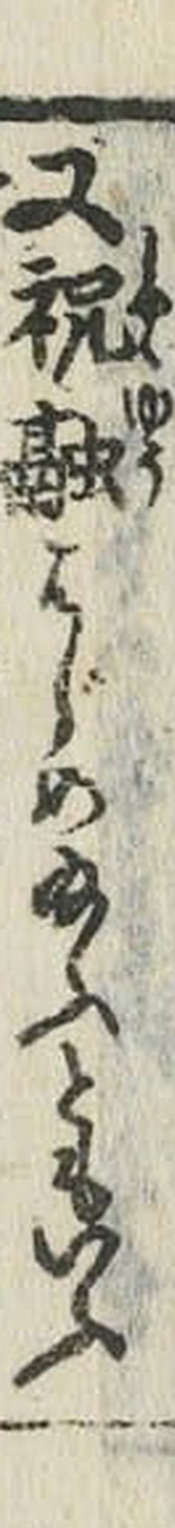又祝融はじめ給ふともいふ
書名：増補頭書訓蒙図彙大成 10巻 2:巻之1-3
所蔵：東京学芸大学教育コンテンツアーカイブ
